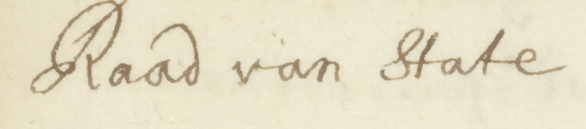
Raad van State
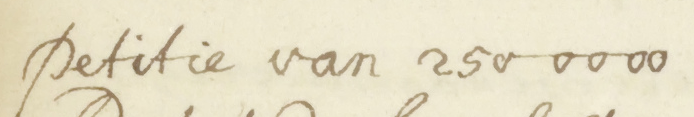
Petitie van 2500000
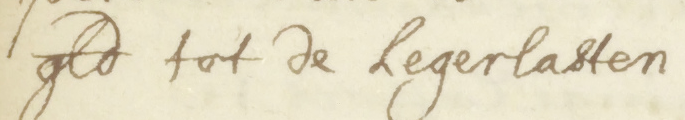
gld tot de Legerlasten
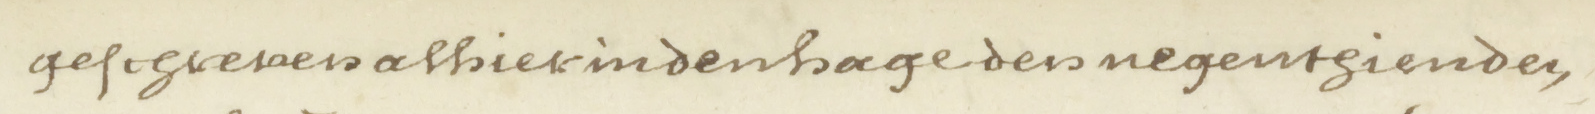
geschreven alhier inden Hage den negenthienden
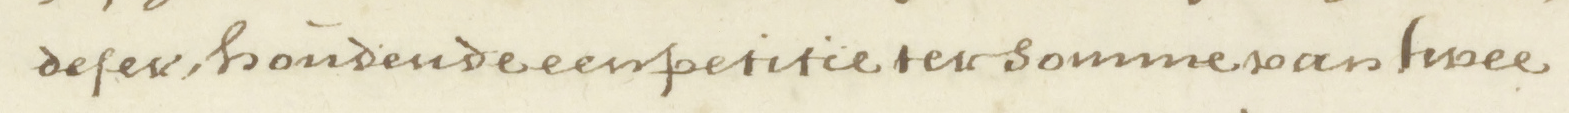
deser, houdende een petitie ter somme van twee
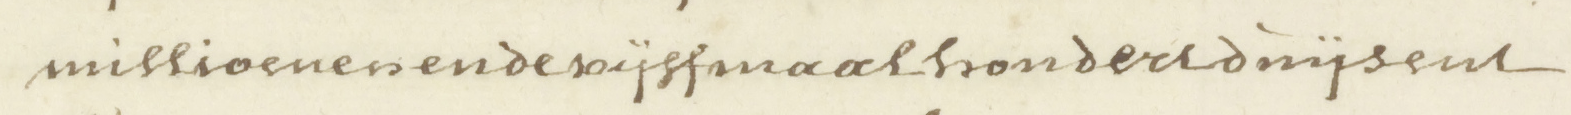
millioenen ende vijffmaal hondert duijsent
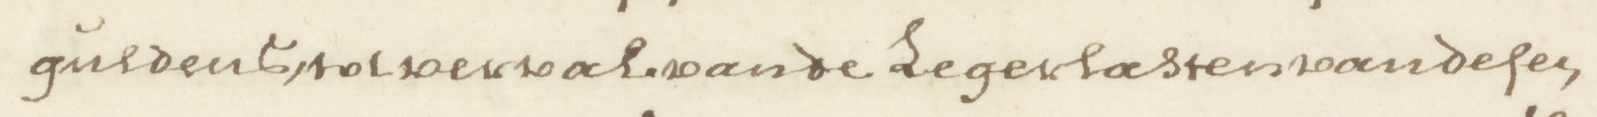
guldens, tot verval vande legerlasten van desen
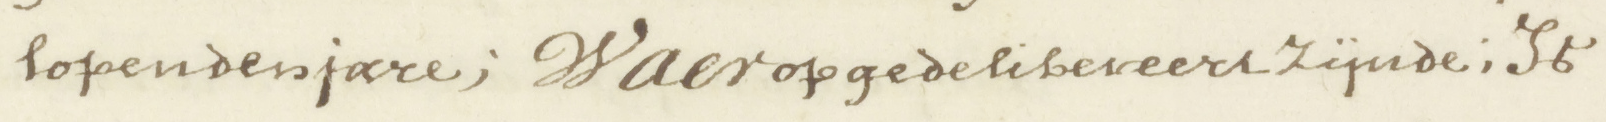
lopenden jare; Waerop gedelibereert zijnde, is
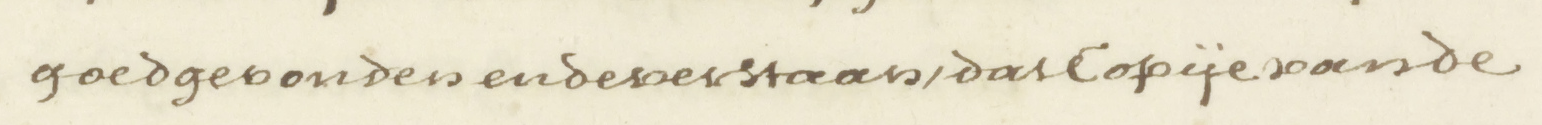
goedgevonden ende verstaan, dat copije van de
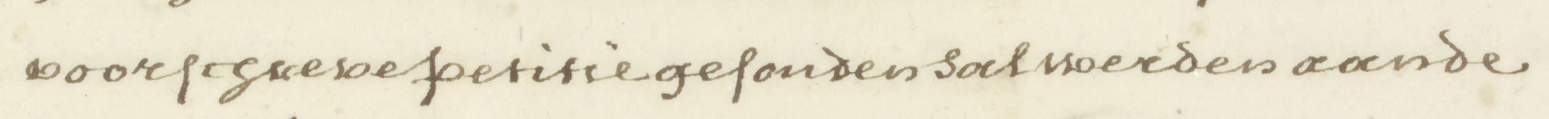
voorschreve petitie gesonden sal werden aan de
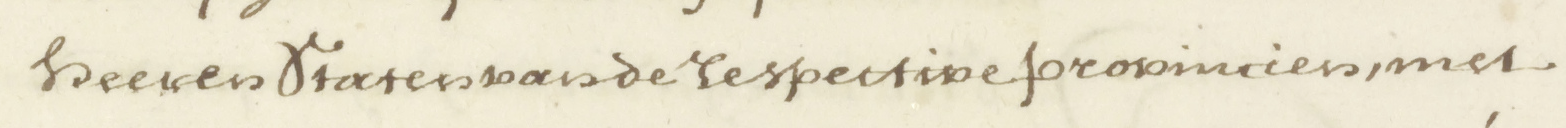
heeren Staten van de respective provincien, met
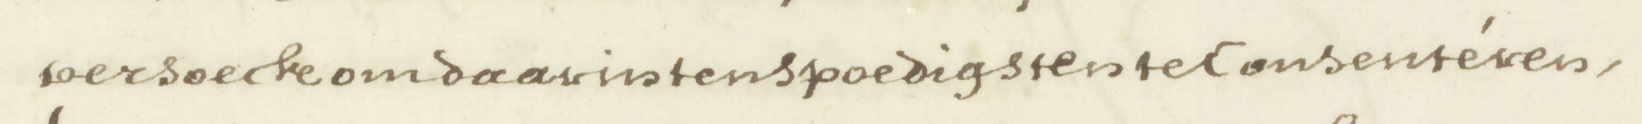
versoeck om daarin ten spoedigsten te consenteren,
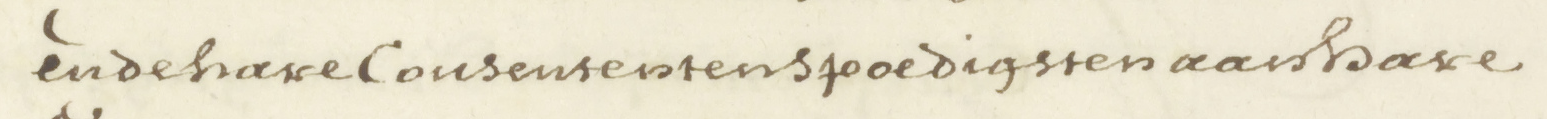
ende hare consenten ten spoedigsten aan hare
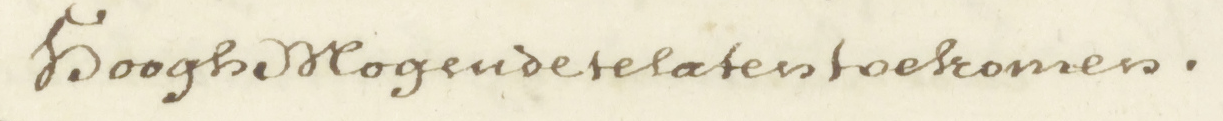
Hoogh Mogende te laten toekomen.
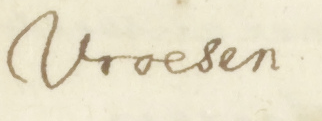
Vroesen
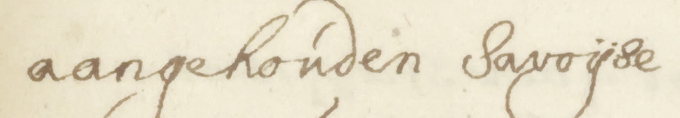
aangehouden Savoijse
